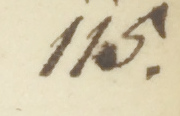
115.
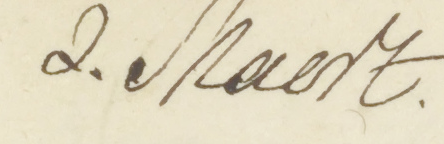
2. Maert.
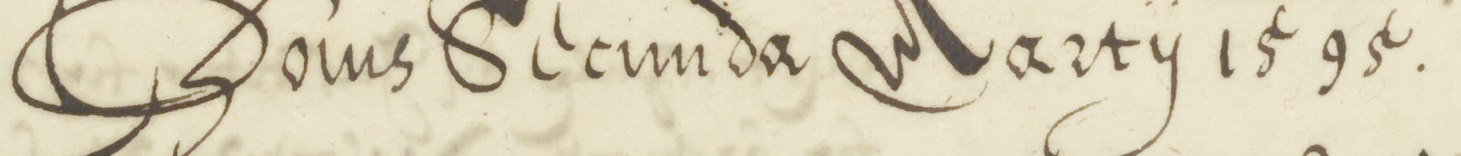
Iovis Secunda Martij 1595.
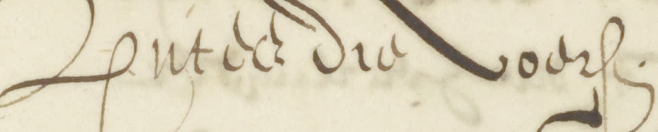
Putee die voers
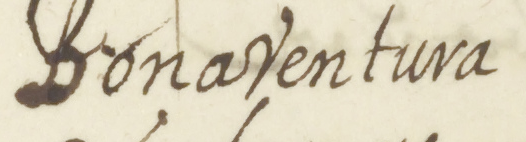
Bonaventura
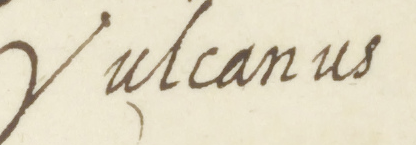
Vulcanus
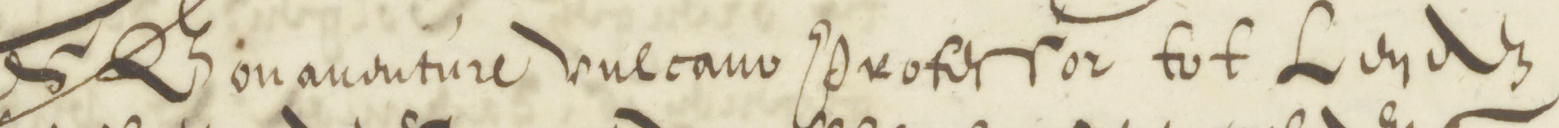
es Bonaventure Vulcano Professor tot Leyden
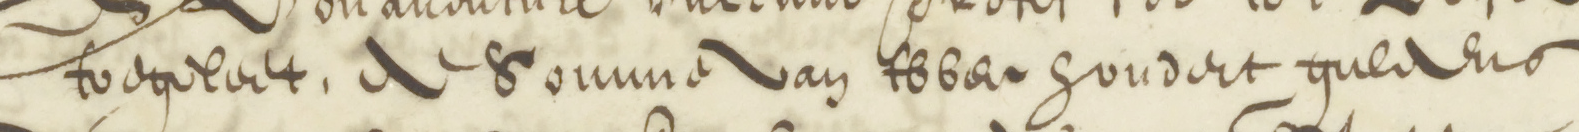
toegeleet, de Somme van twee hondert guldens
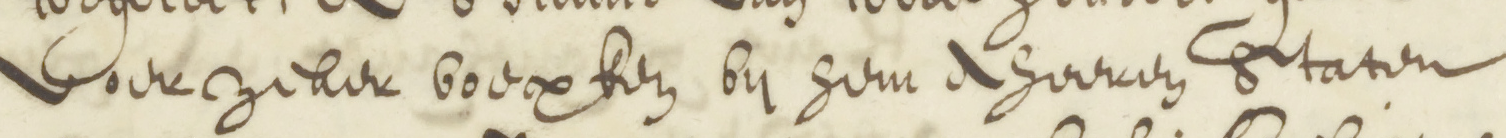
voer zeker boecxken by hem dheeren Staten
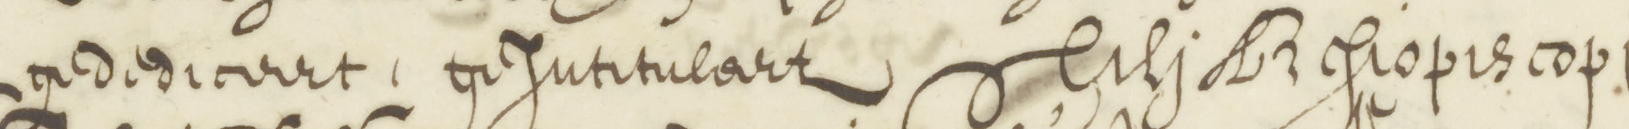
gedediceert, geIntituleert Nili Archiopiscopi
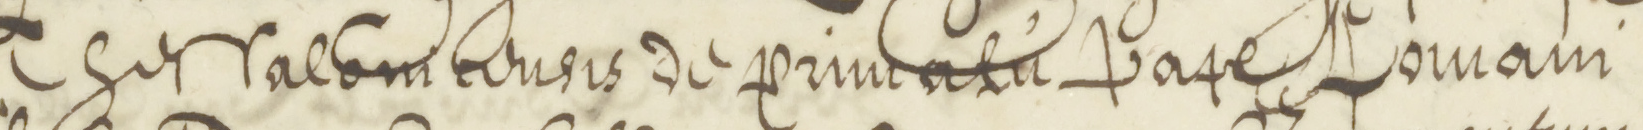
Thessalonicensis de primatu Pape Romani
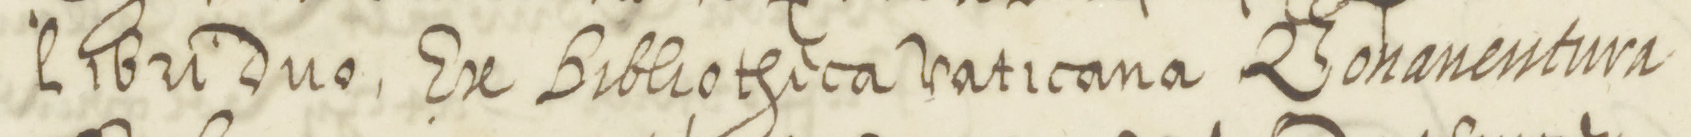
libri duo. Ex Bibliotheca Vaticana Bonaventura
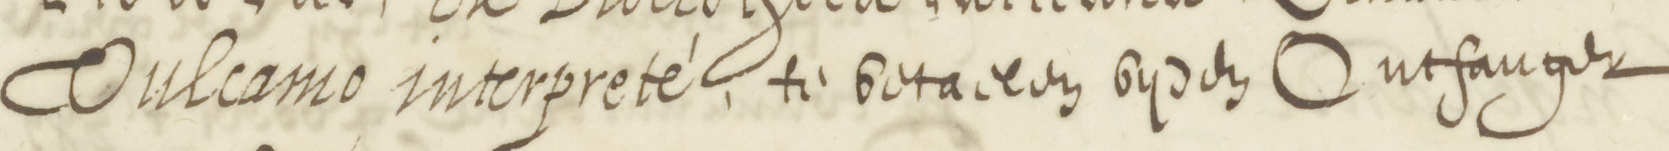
Vulcanio interpreté, te betaelen byden Ontfanger
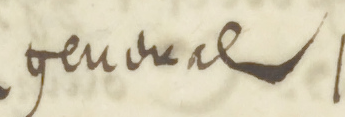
general.
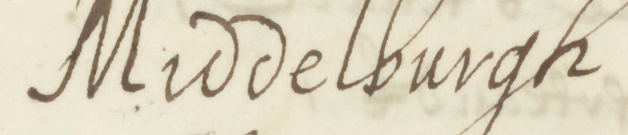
Middelburgh
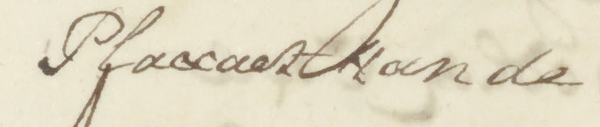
Placcaet van de
